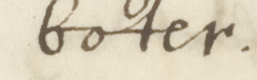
boter.
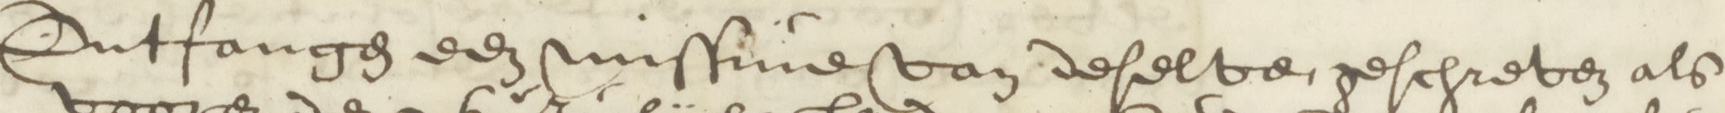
Ontfangen een missive van deselve, geschreven als
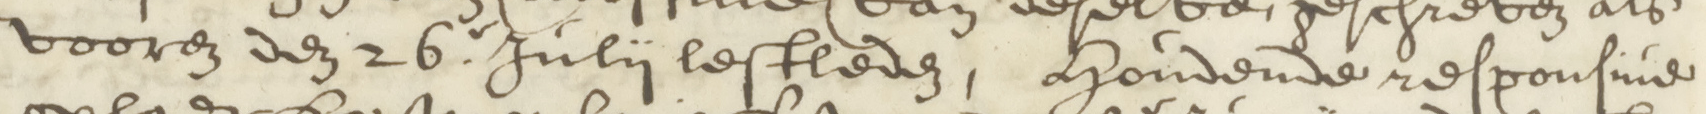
vooren den 26e Julij lestleden, Houdende responsive
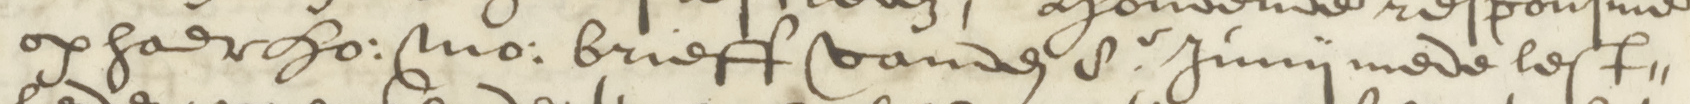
op haer Ho:Mo: brieff vanden 8e Junij mede lest„
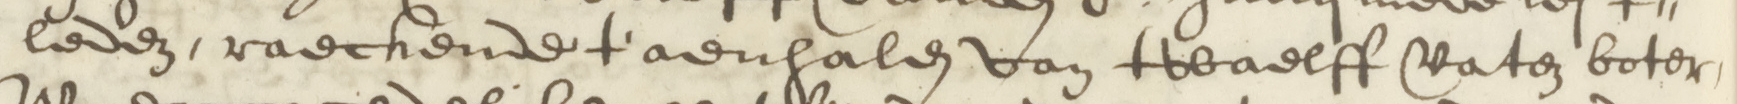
leden, raeckende t'aenhalen van twaelff Vaten boter,
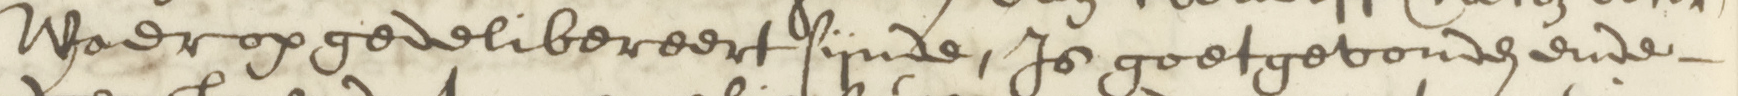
Waerop gedelibereert sijnde, Is goetgevonden ende —
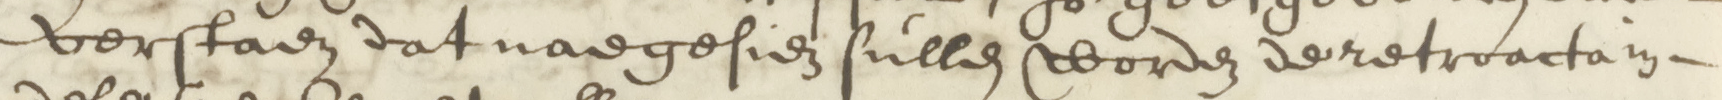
verstaen dat naegesien sullen worden de retroacta in —
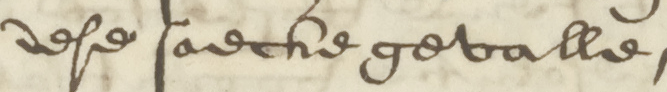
dese saecke gevalle.
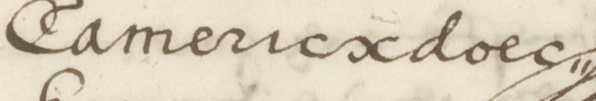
Camericxdoec„
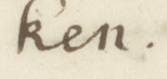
ken.
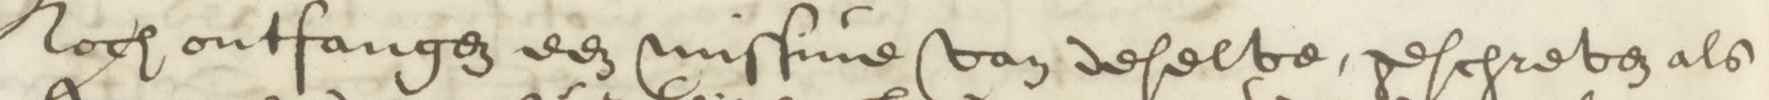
Noch ontfangen een missive van deselve, geschreven als
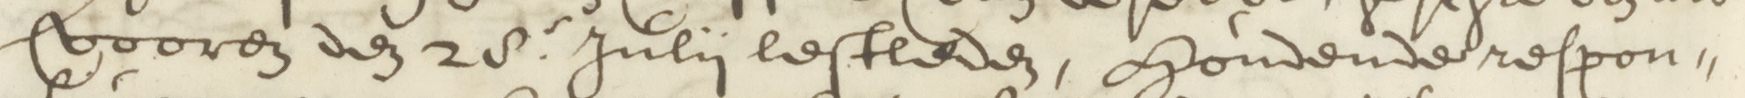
vooren den 28e Julij lestleden, Houdende respon„
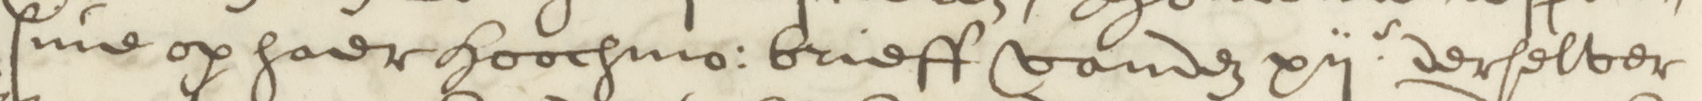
sive op haer Hoochmo: brieff vanden XIIe derselver
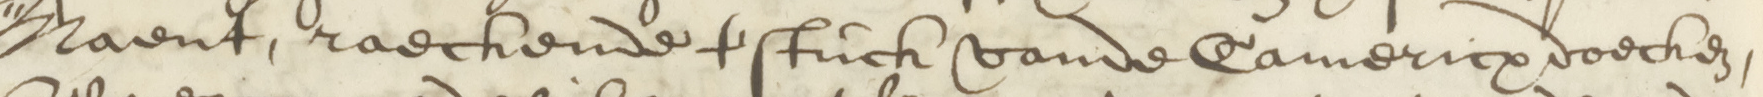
Maent, raeckende t‛stuck vande Camericx doecken,
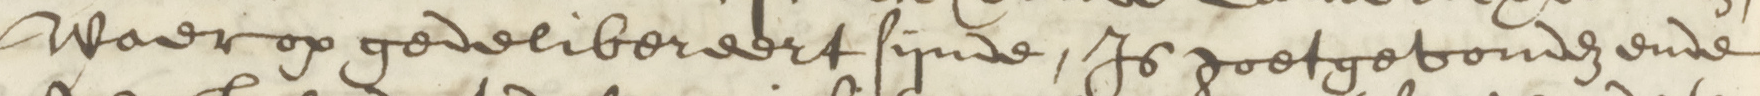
Waerop gedelibereert sijnde, Is goetgevonden ende
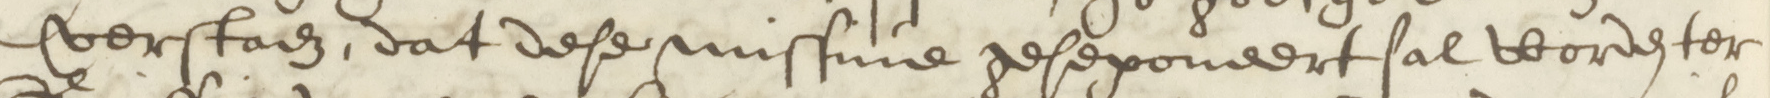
verstaen, dat dese missive geseponeert sal worden ter
